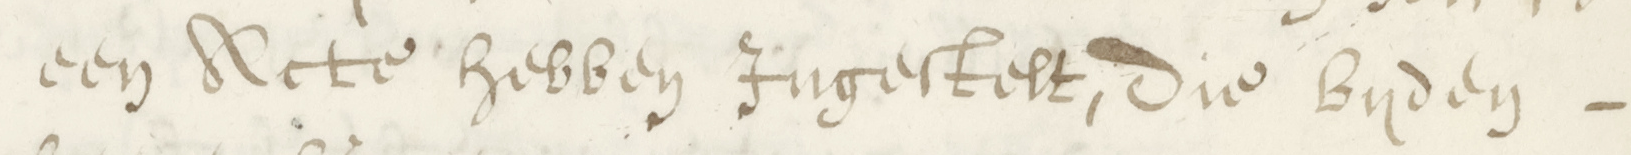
een Acte hebben Ingestelt, die byden -
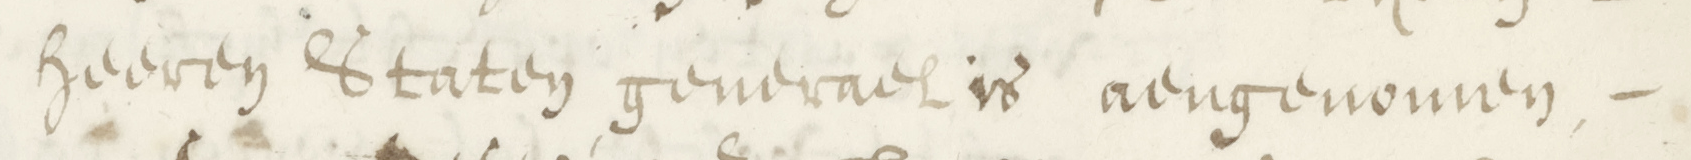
heeren Staten generael is aengenomen -
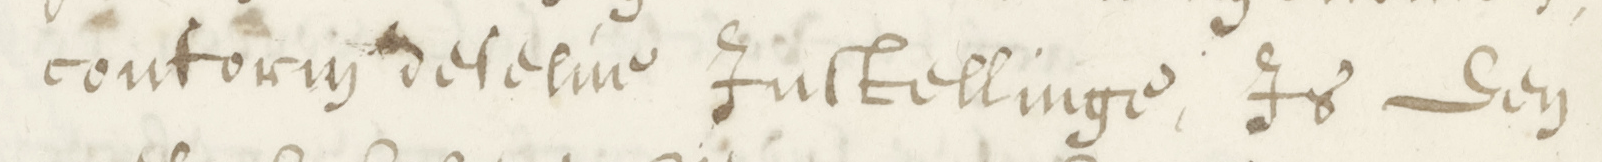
conform deselue Instellinge, Is Een
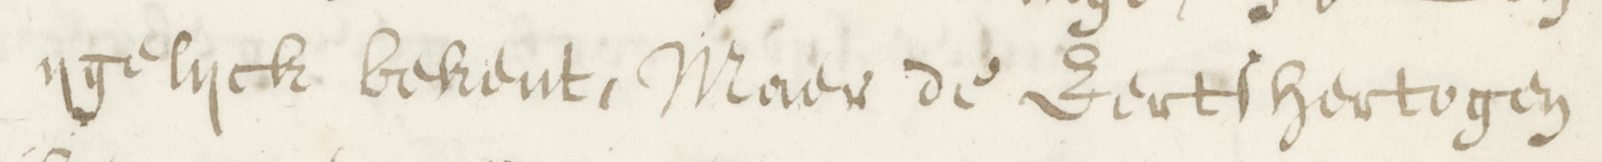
ygelyck bekent, Maer de Eertshertogen
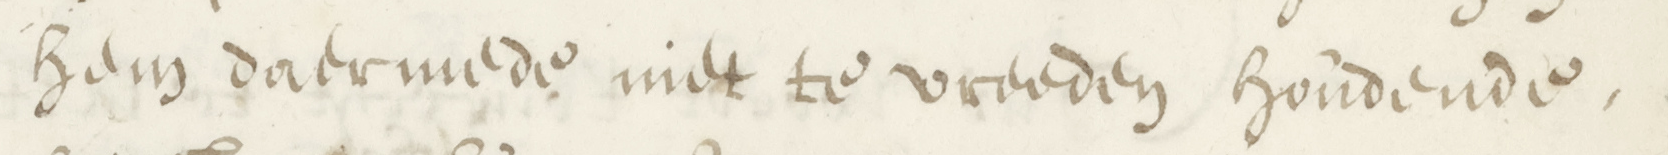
hem daermede niet te vreeden houdende,
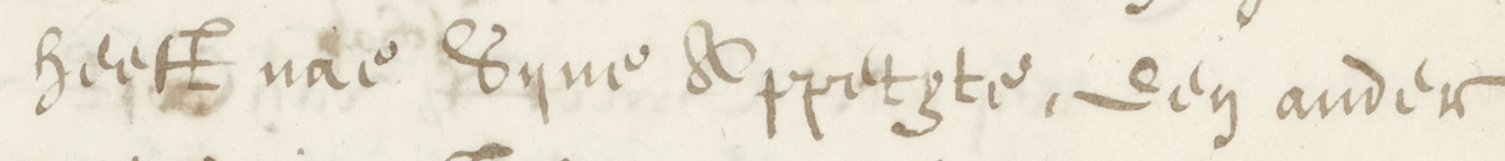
heeft nae Syne Appetyte, Een ander
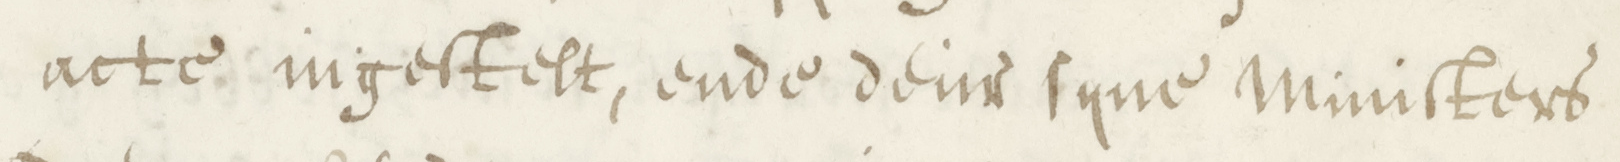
acte ingestelt, ende deur syne ministers
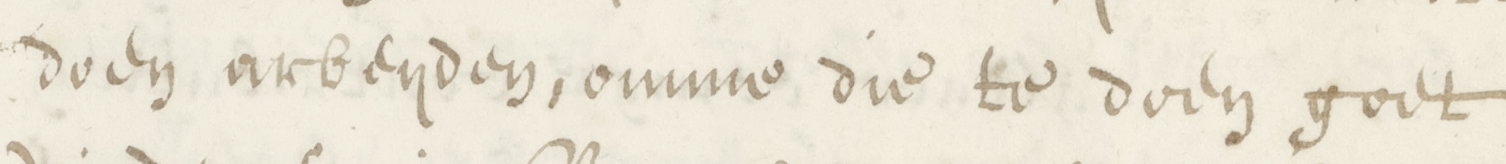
doen arbeyden, omme die te doen goet
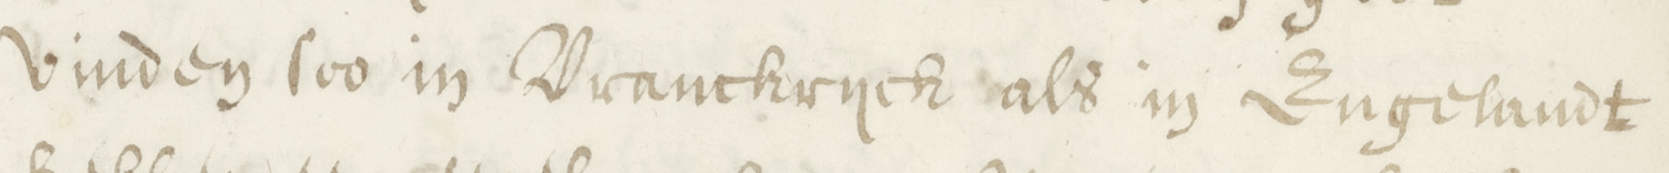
vinden soo in Vranckryck als in Engelandt
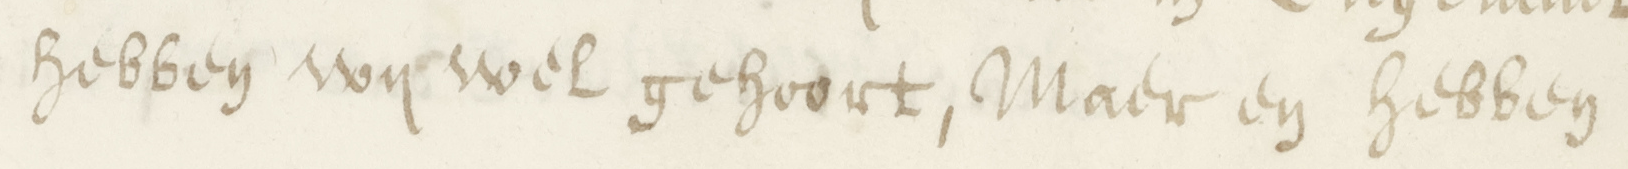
hebben wy wel gehoort, Maer en hebben
